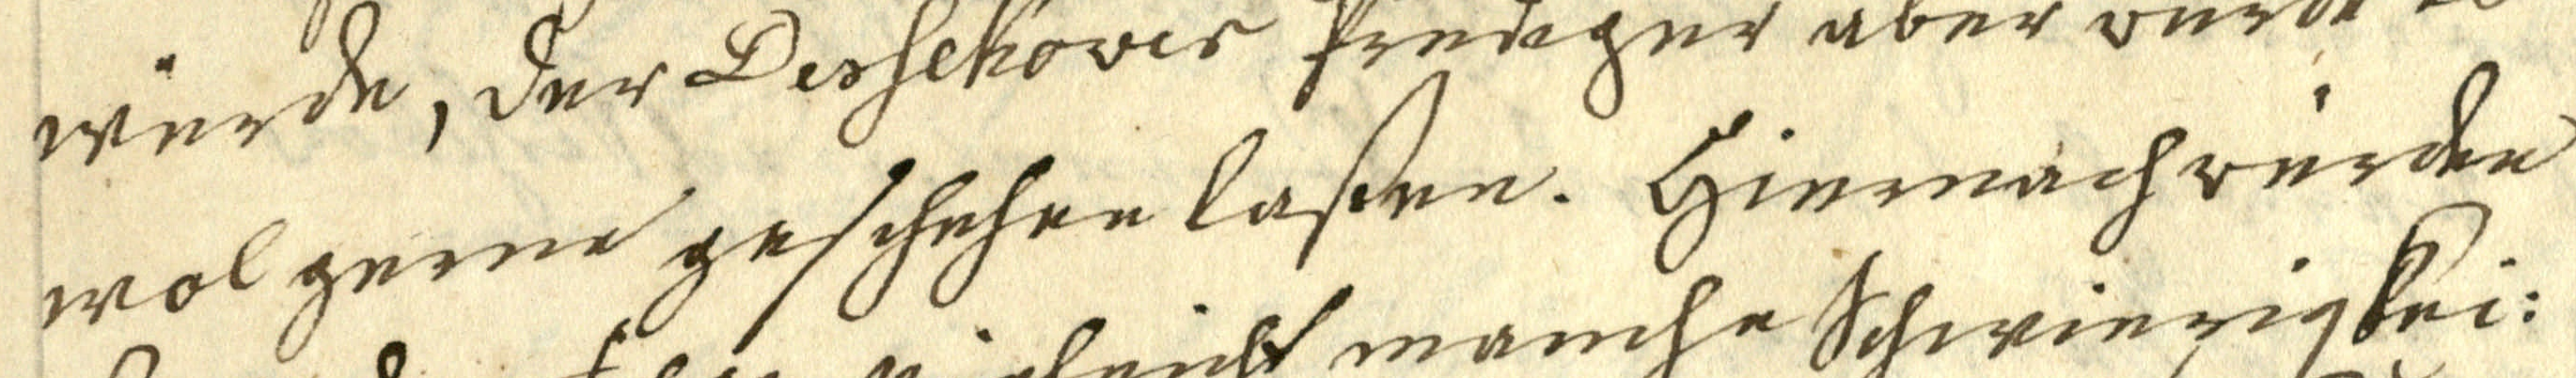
wol gerne geschehen laßen. Hiernach würden
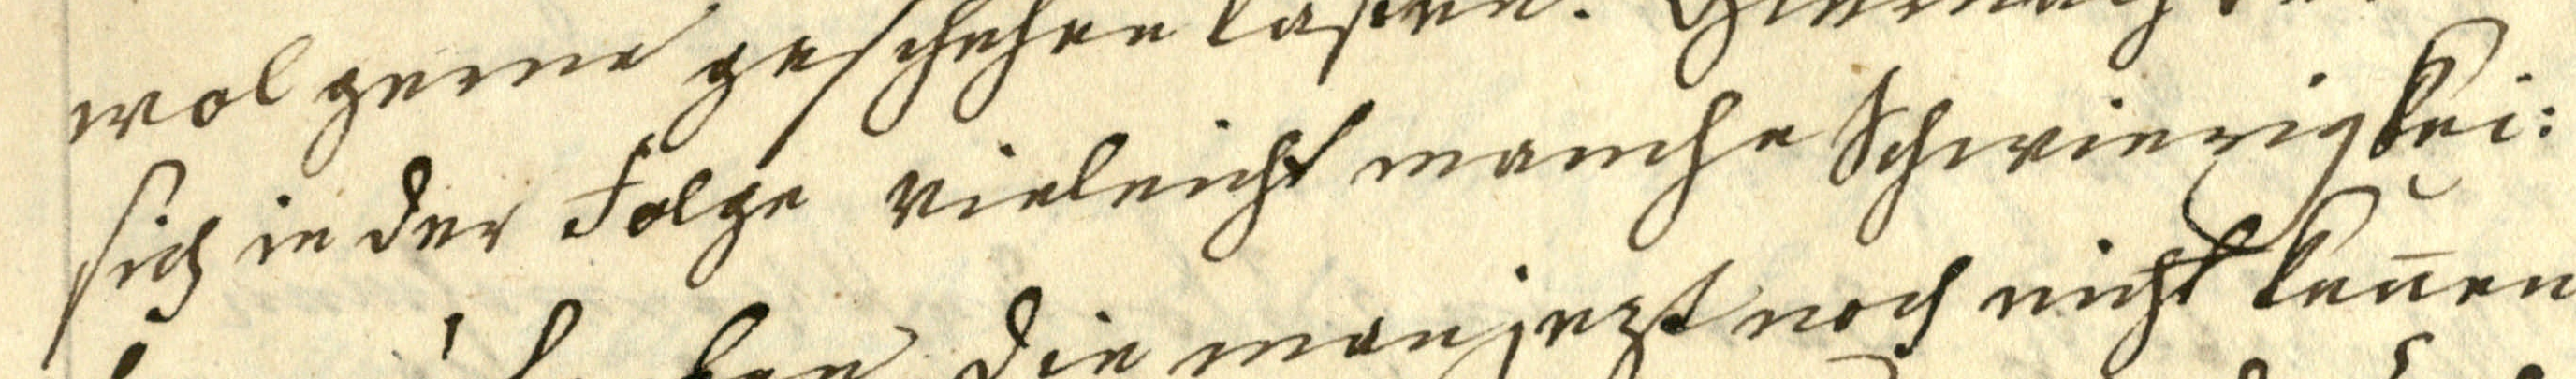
sich in der Folge vieleicht manche Schwierigkei¬
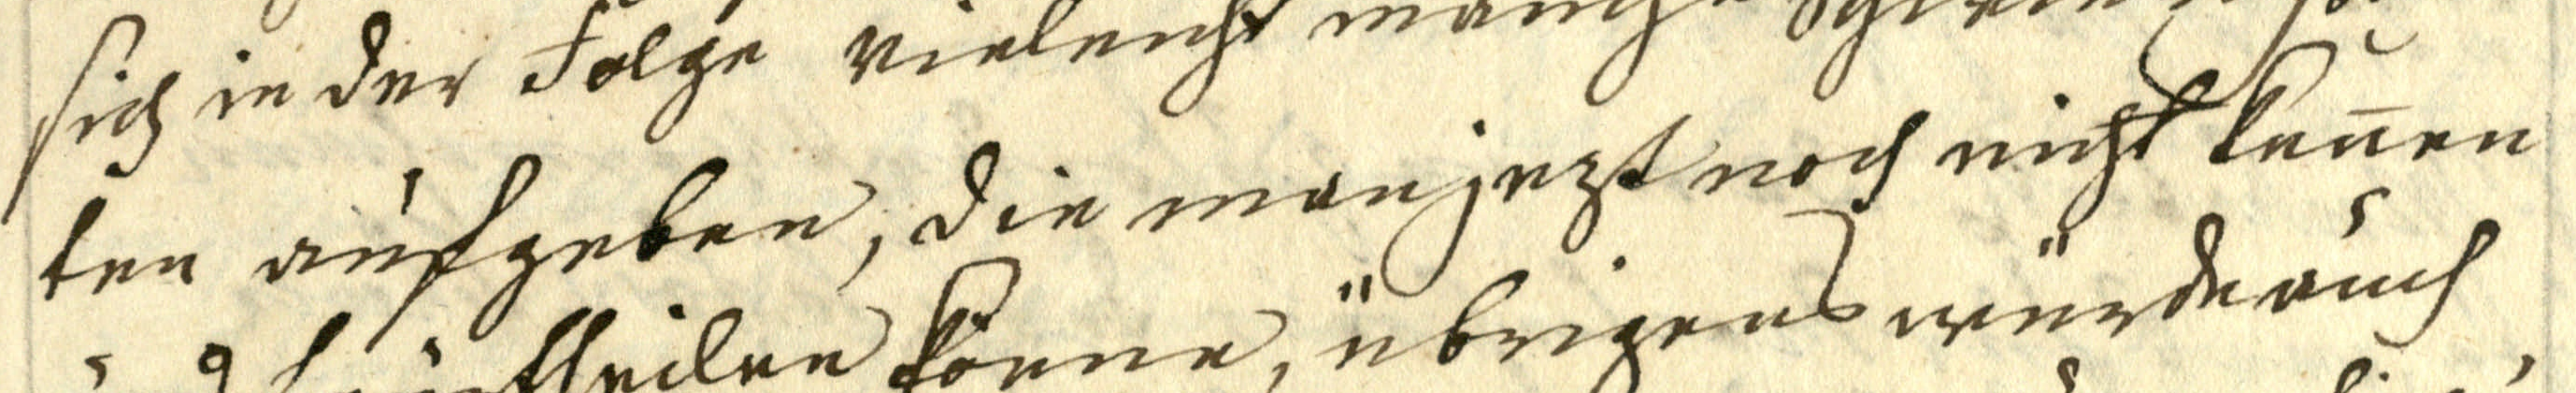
ten aufgeben, die man jezt noch nicht kenen
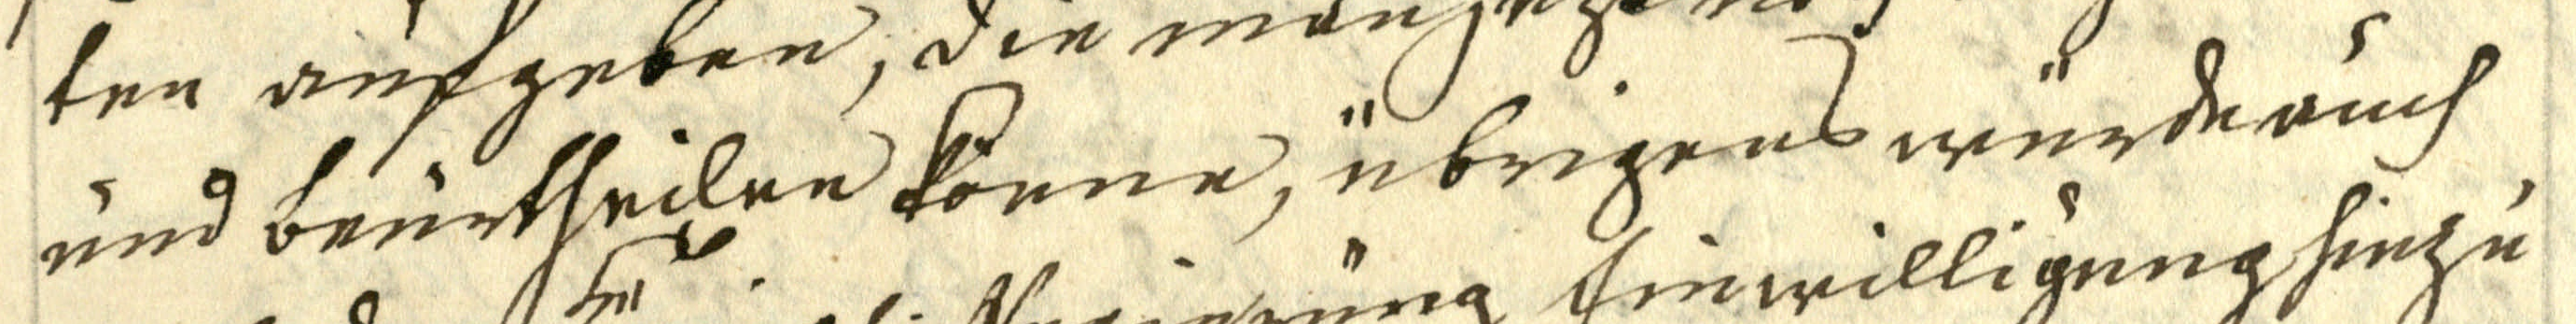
und beurtheilen könne, übrigens würde auch
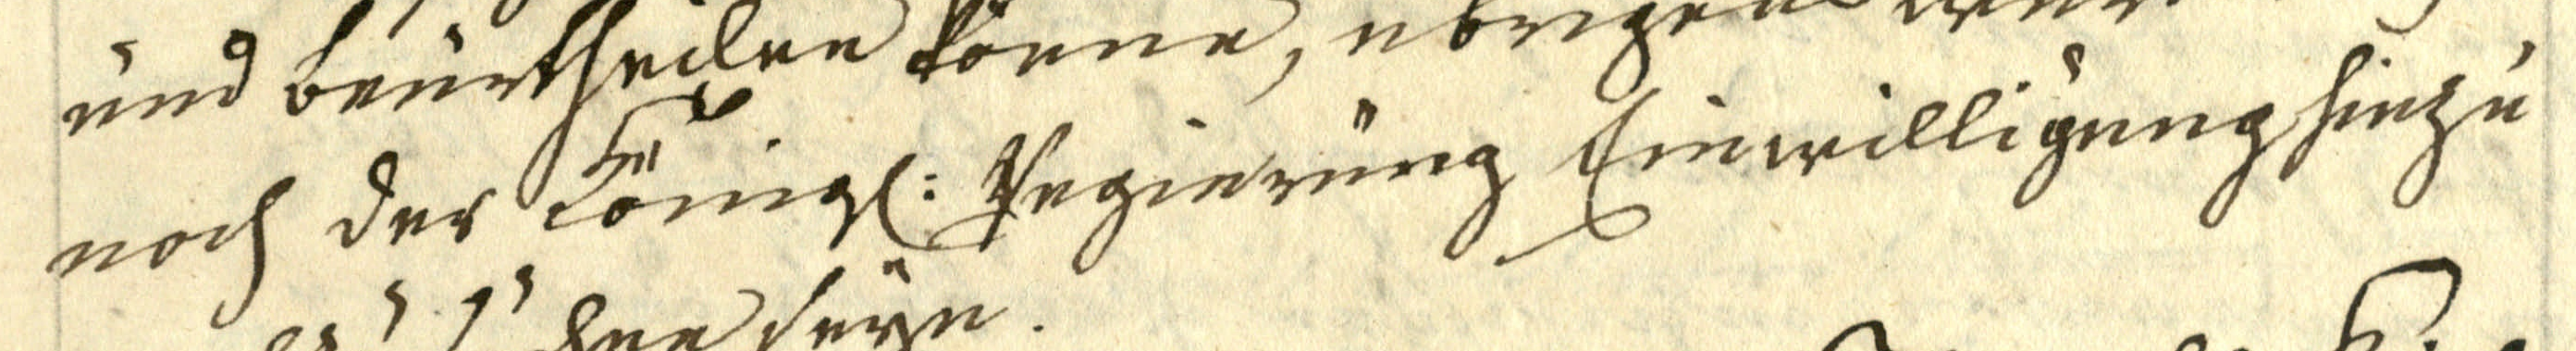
noch der Königl. Regierung Einwilligung hiezu
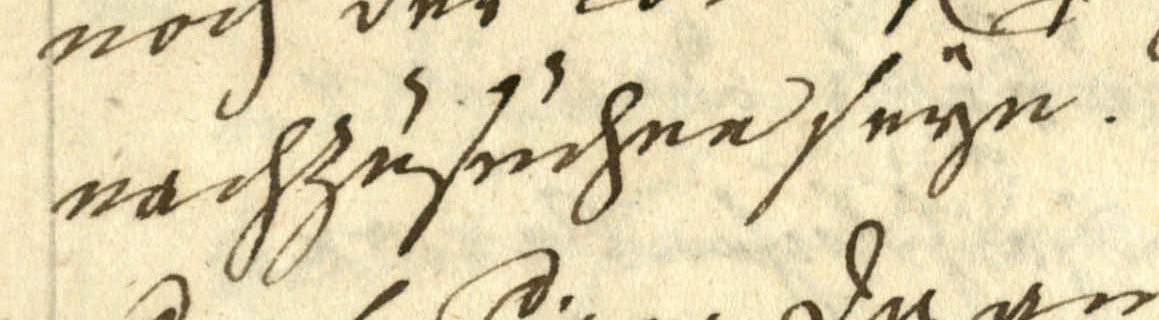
nachzusuchen seÿn.
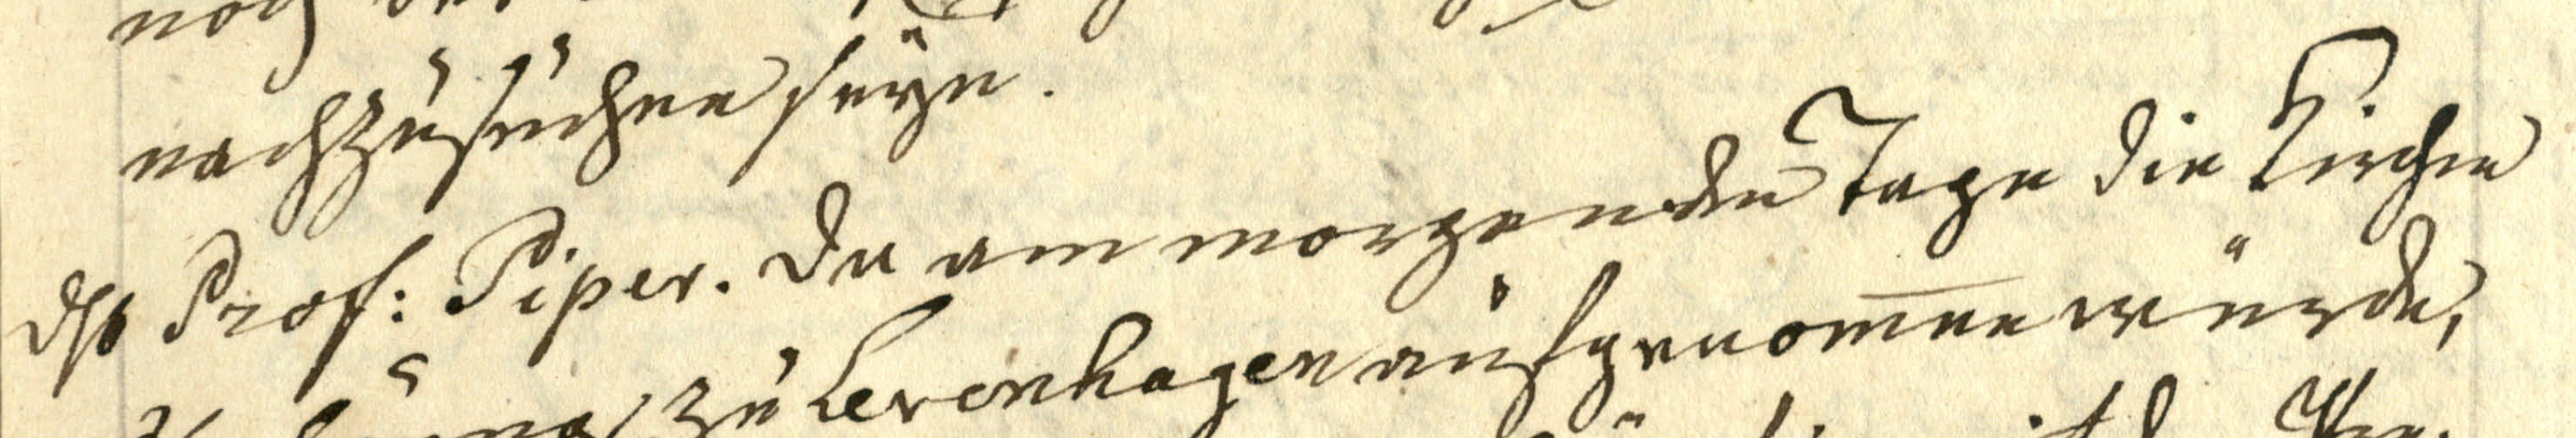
dh Prof. Piper. Da am morgenden Tage die Kirchen
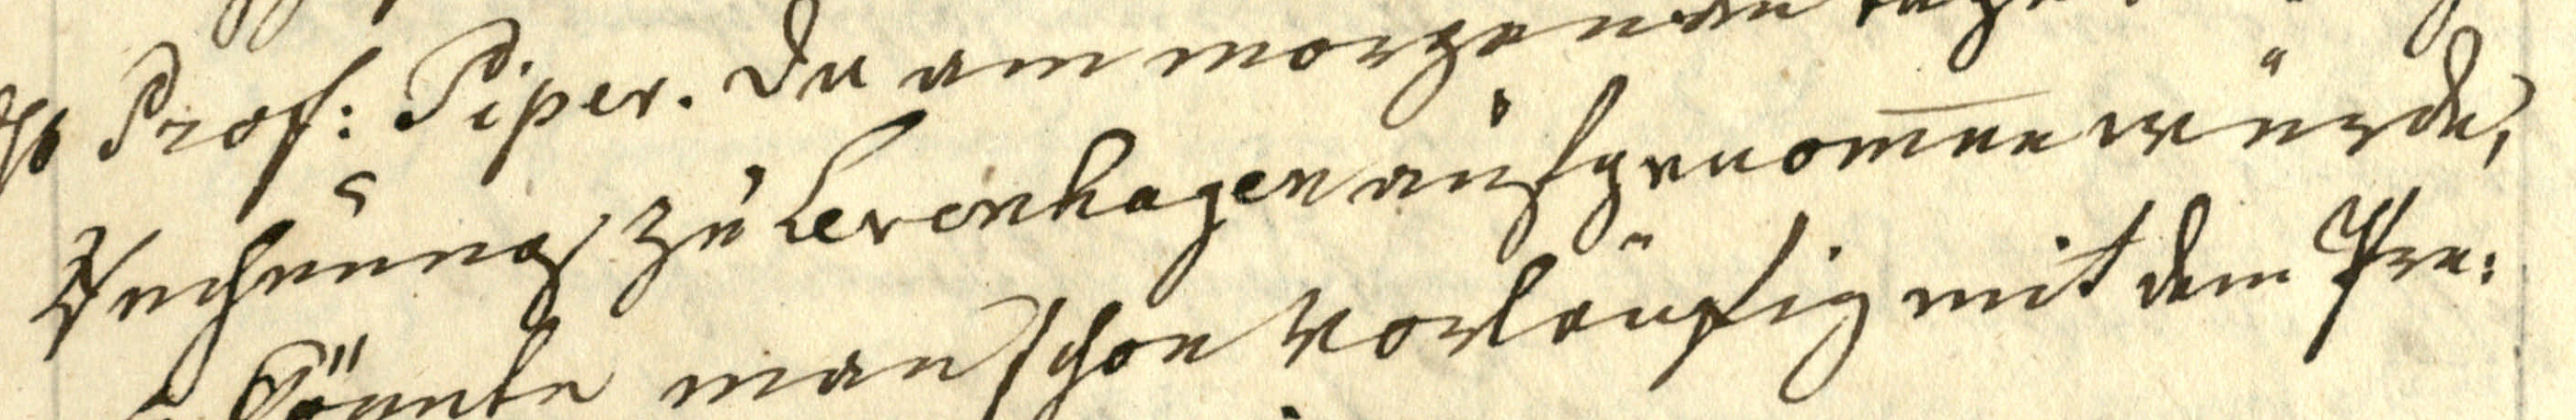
Rechnung zu Levenhagen aufgenomen würde,
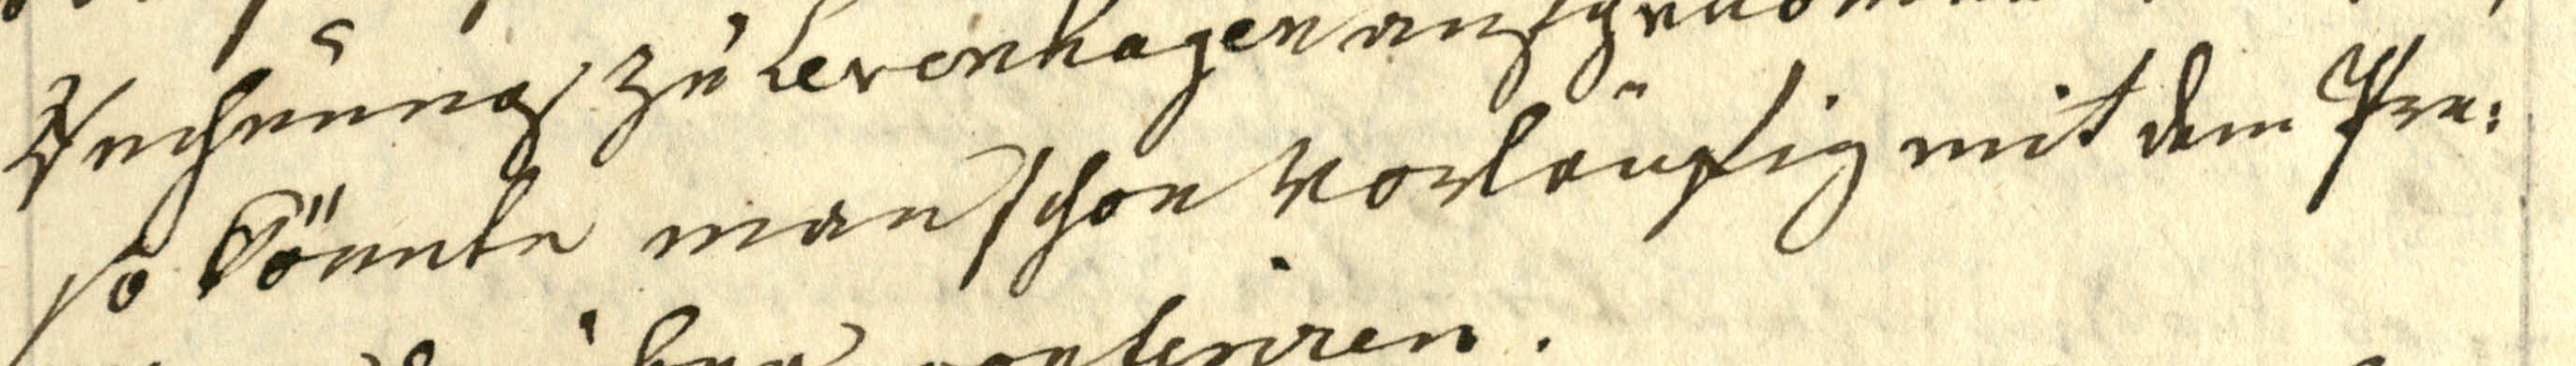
so könnte man schon vorläufig mit dem Pre¬
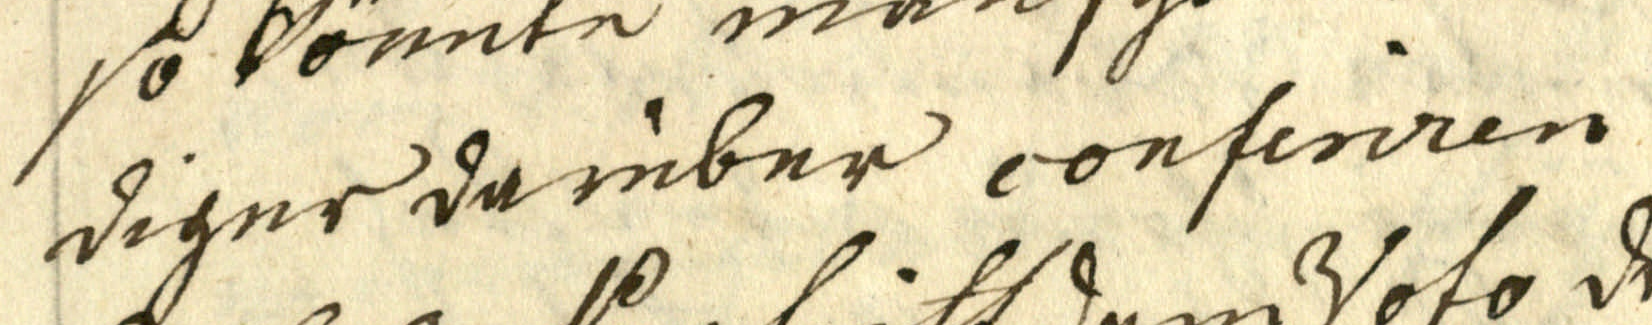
diger darüber conferiren.
